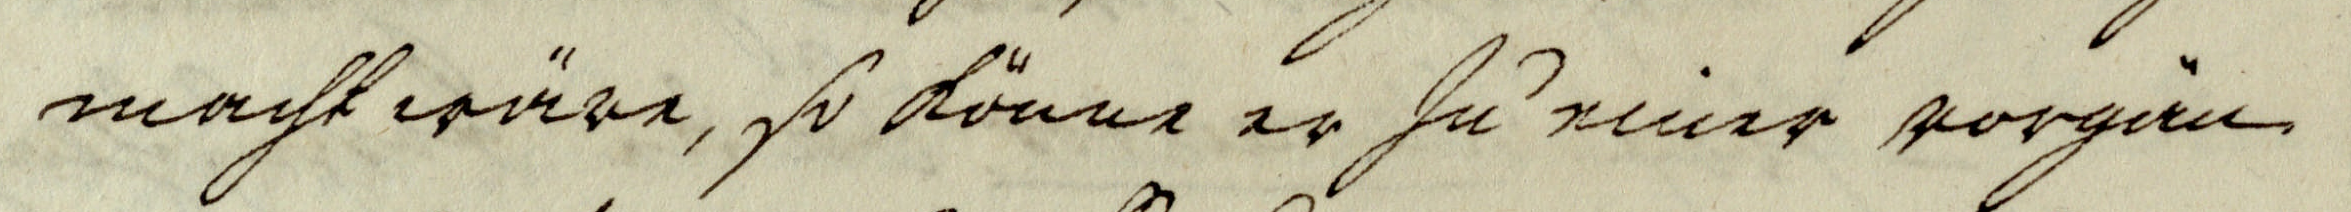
macht wäre, so könne er zu einer vorgän¬
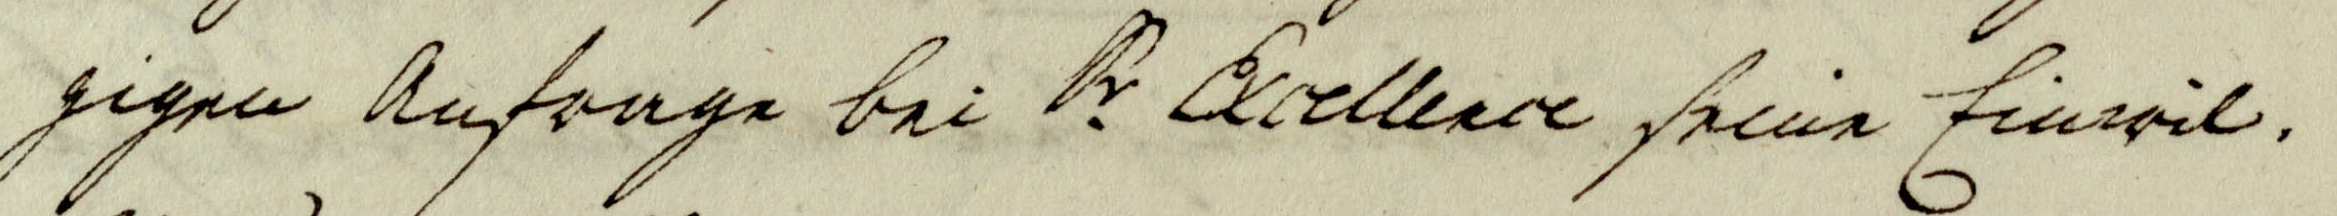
gigen Anfrage bei Sr. Excellence seine Einwil¬
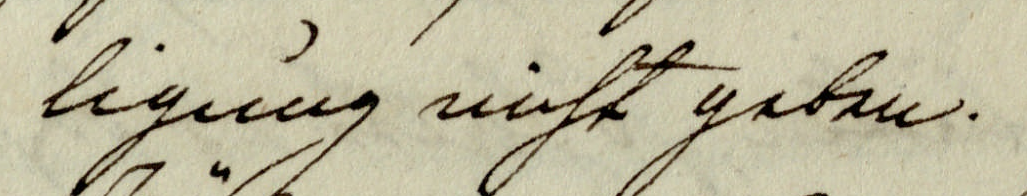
ligung nicht geben.
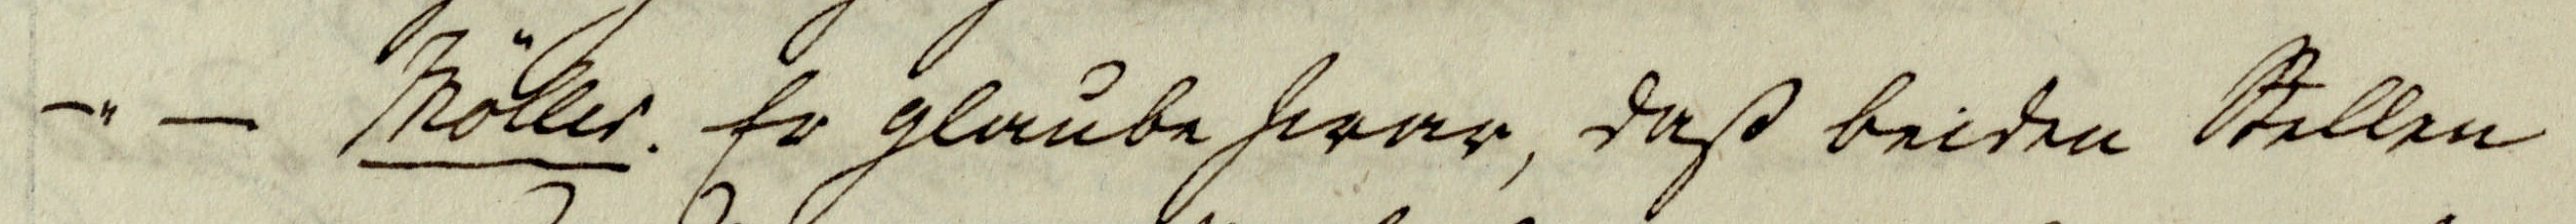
— " — . Möller. Er glaube zwar, daß beiden Stellen
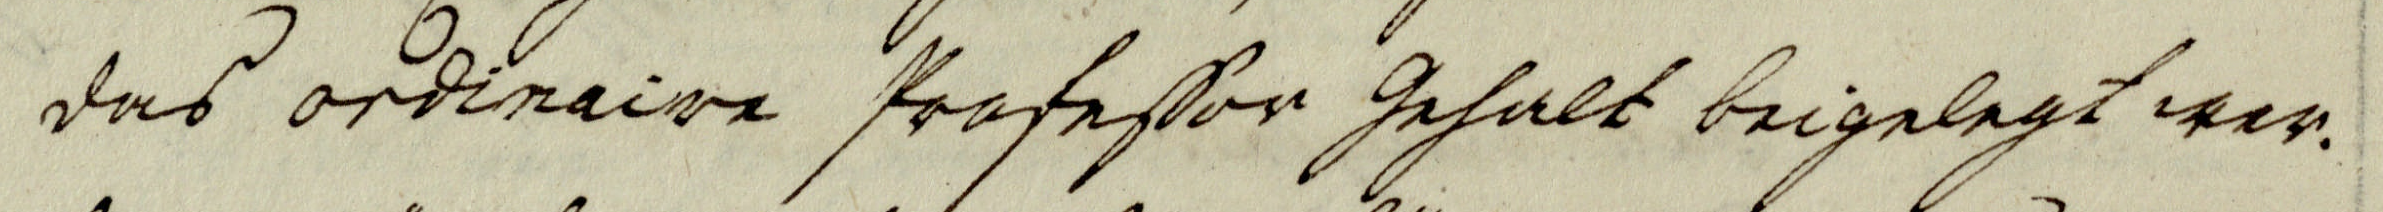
das ordinaire Professor Gehalt beigelegt wer¬
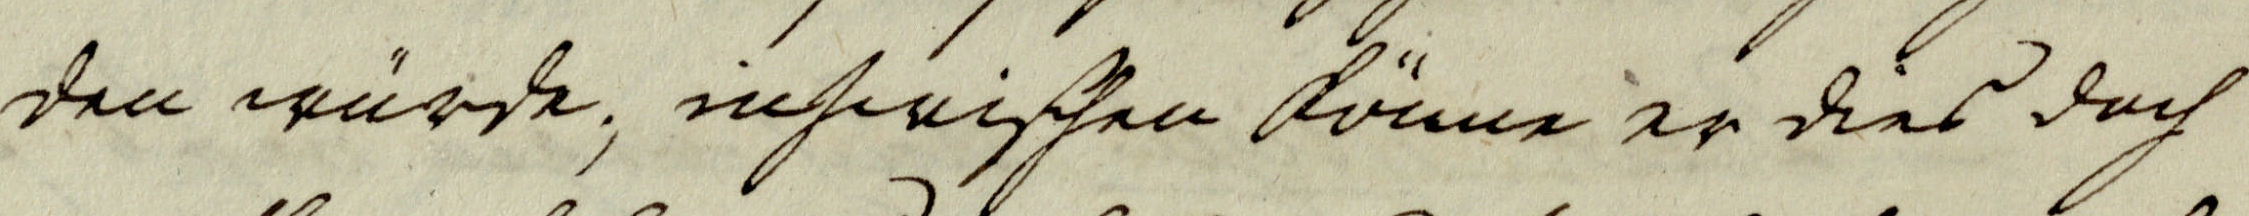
den würde; inzwischen könne er das doch
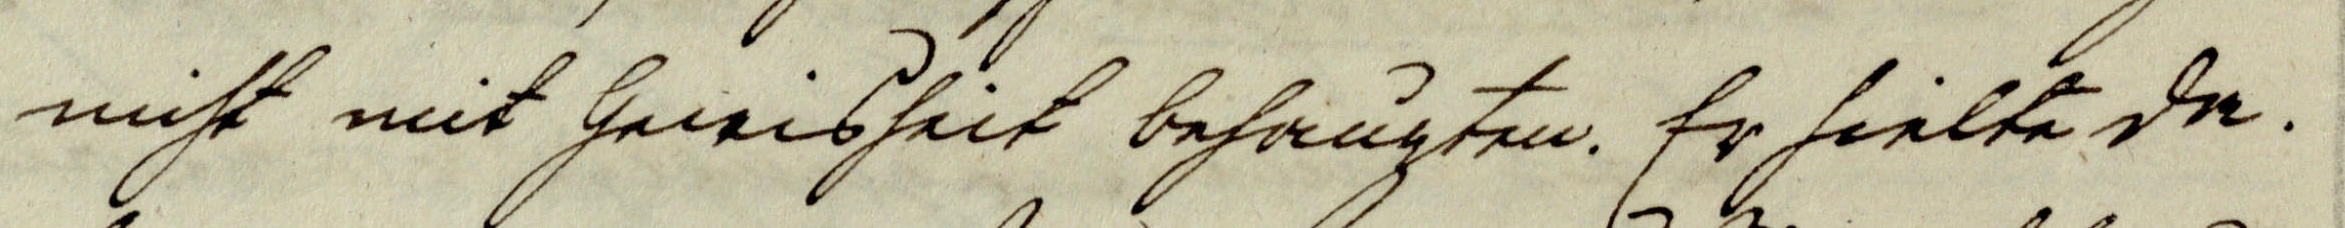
nicht mit Gewisheit behaupten. Er hielte da¬
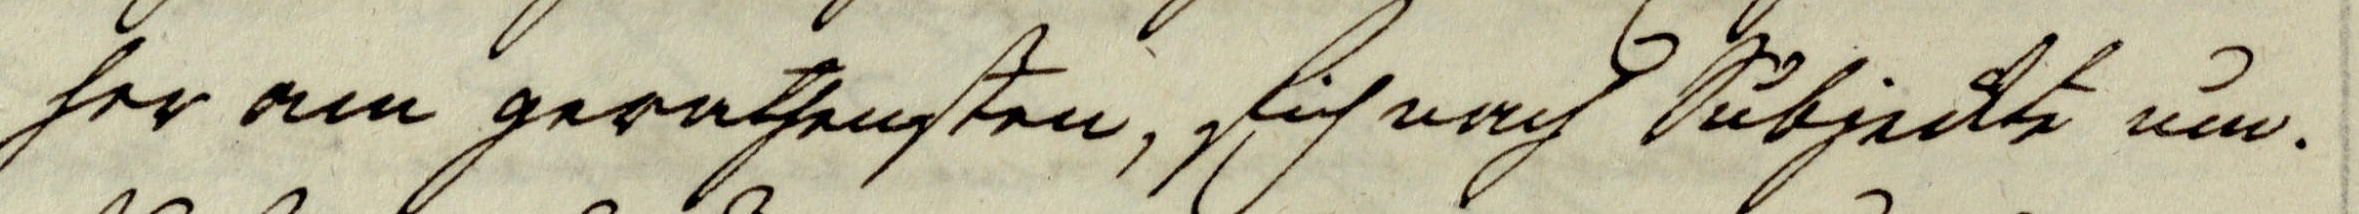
her am gerathensten, sich nach Subjekte um¬
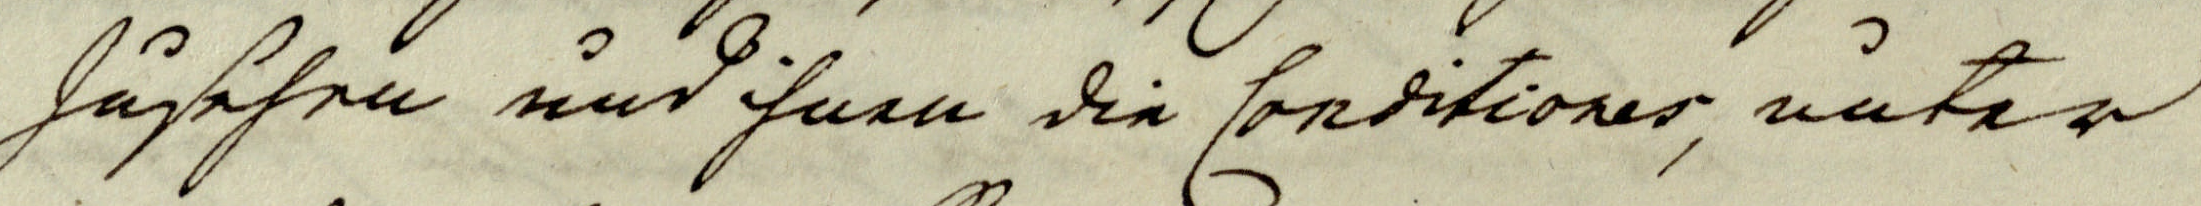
zusehen und ihnen die Conditiones, unter
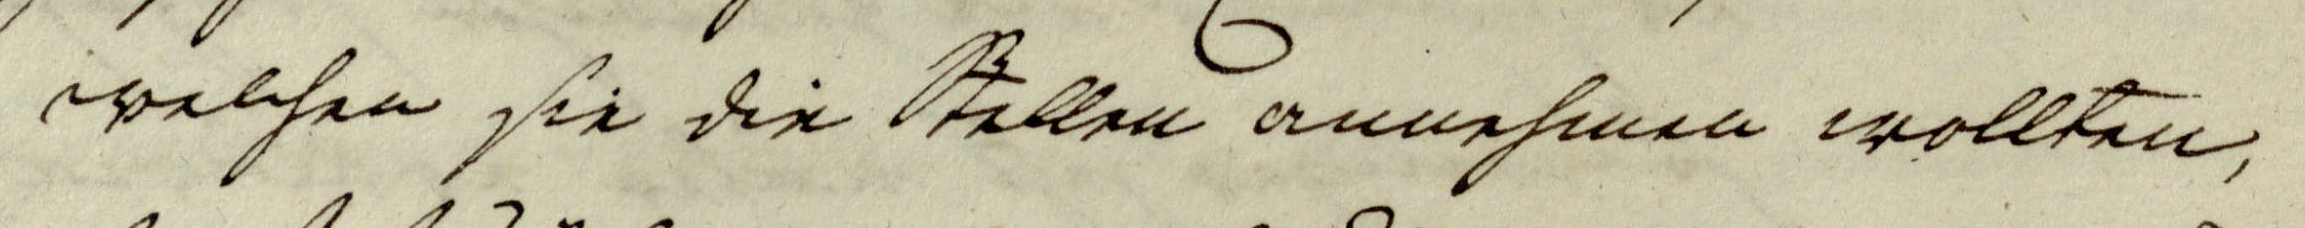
welchen sie die Stellen annehmen wollten,
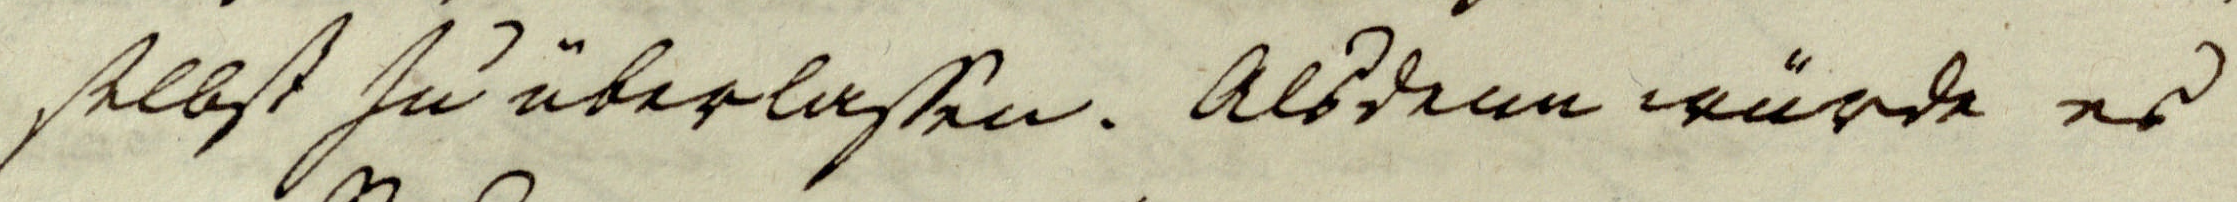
selbst zu überlassen. Alsdann würde es
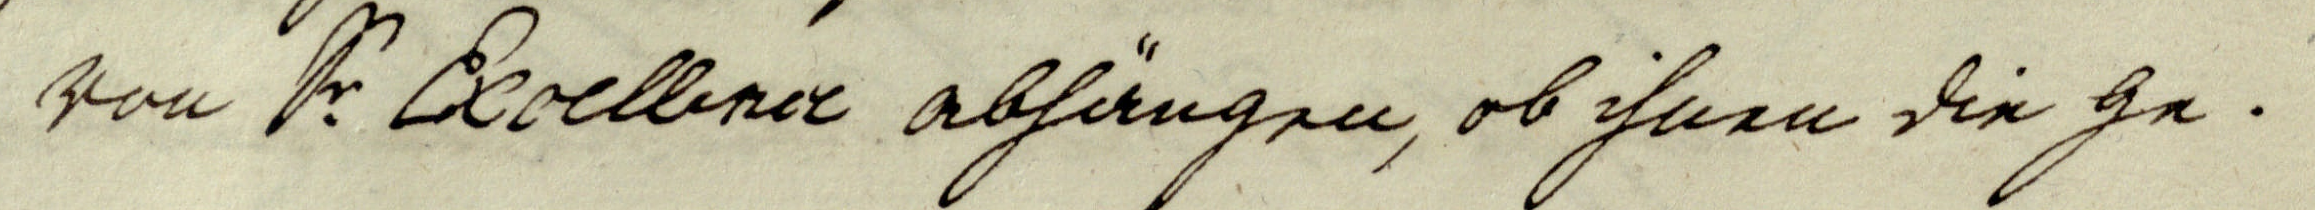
von Sr. Excellence abhängen, ob ihnen die ge¬
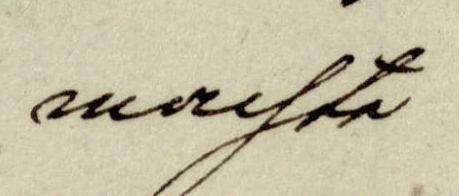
machte
